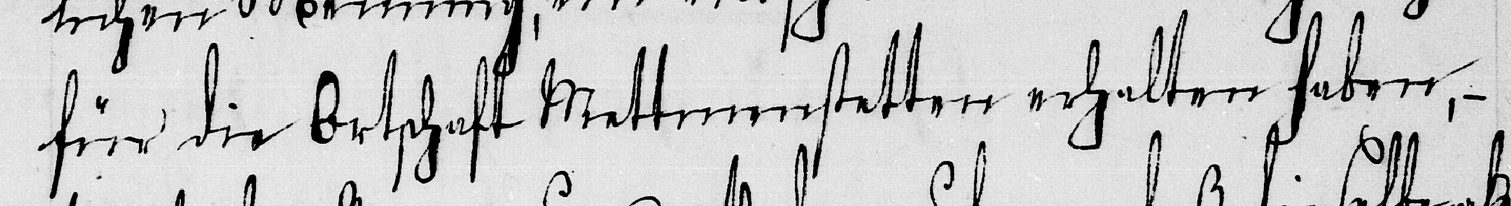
für die Ortschaft Mettmenstetten erhalten haben, –
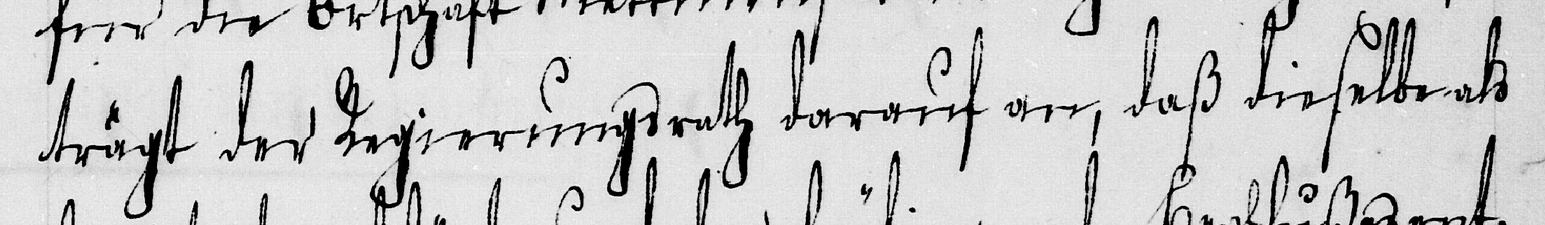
trägt der Regierungsrath darauf an, daß dieselbe als
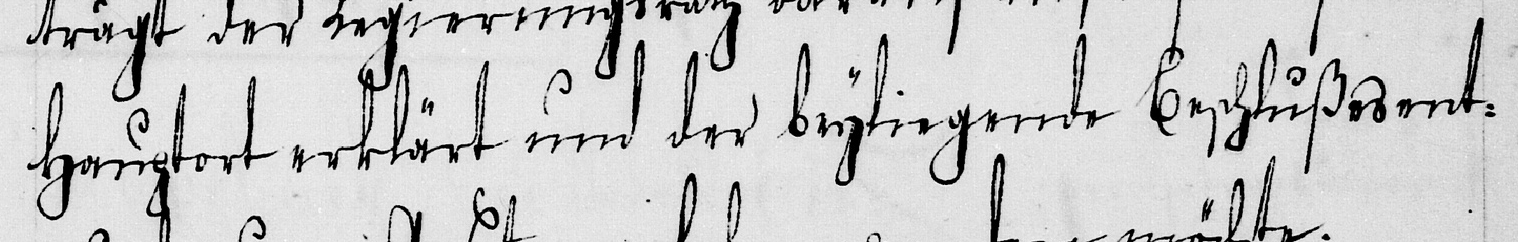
Hauptort erklärt und der beyliegende Beschlußesent¬
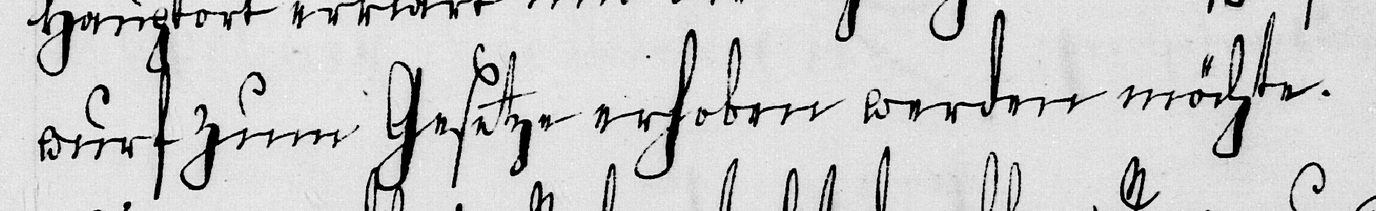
wurf zum Gesetze erhoben werden möchte.
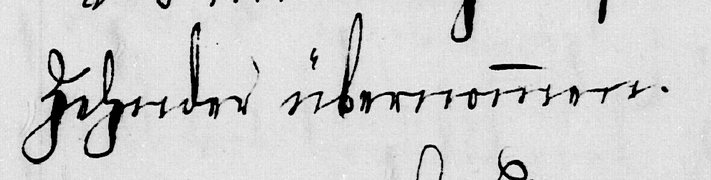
Zehnder übernommen.
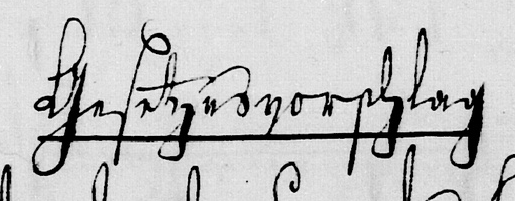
Gesetzesvorschlag
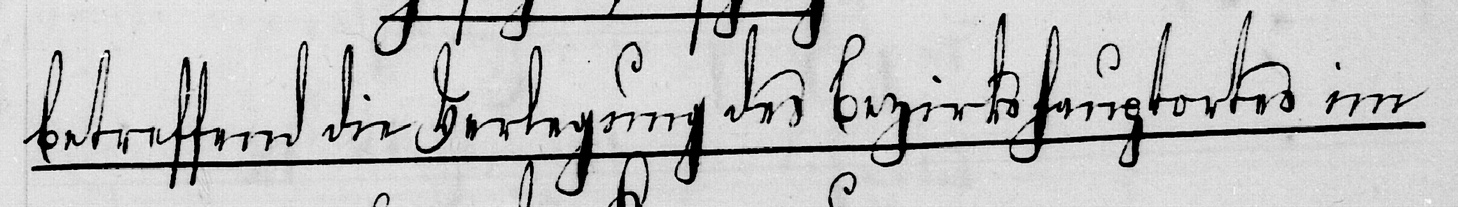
betreffend die Verlegung des Bezirkshauptortes im
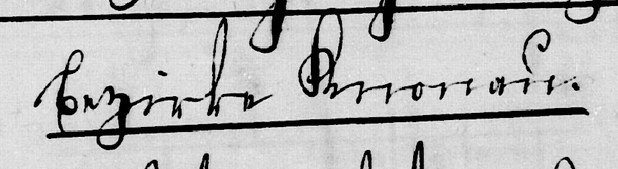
Bezirke Knonau
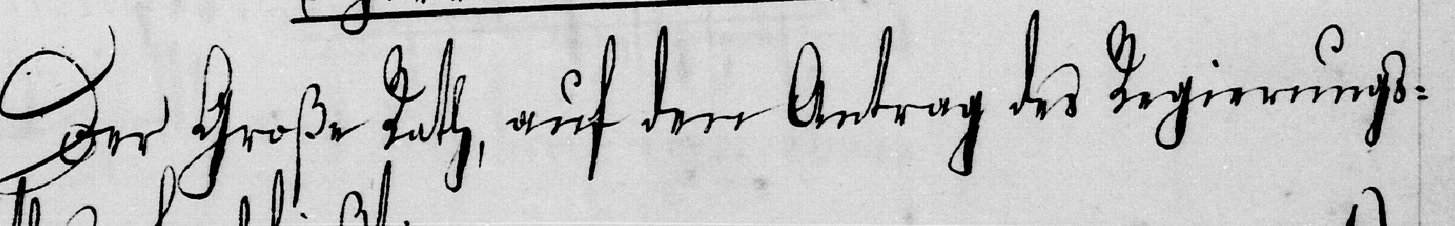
Der Große Rath, auf den Antrag des Regierungs¬
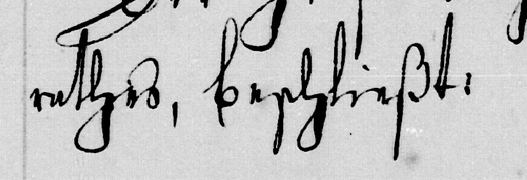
rathes, beschließt:
